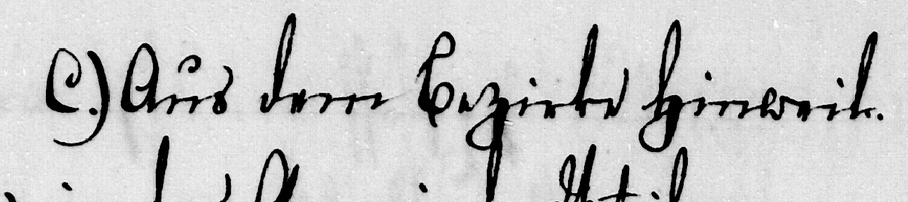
C.) Aus dem Bezirke Hinweil.
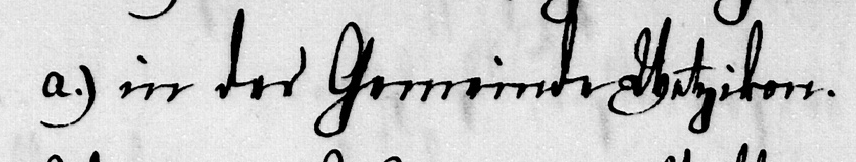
a.) in der Gemeinde Wetzikon.
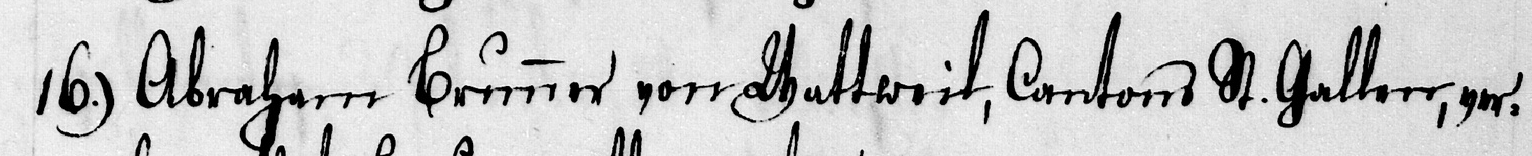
16.) Abraham Brunner vom Wattweil, Cantons St. Gallen, ve¬
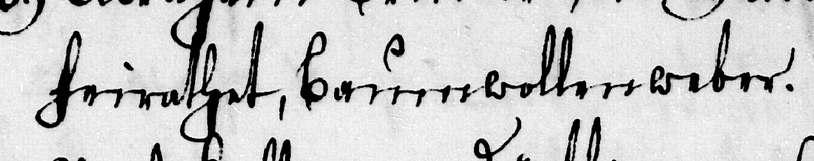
rheirathet, Baumwollenweber.
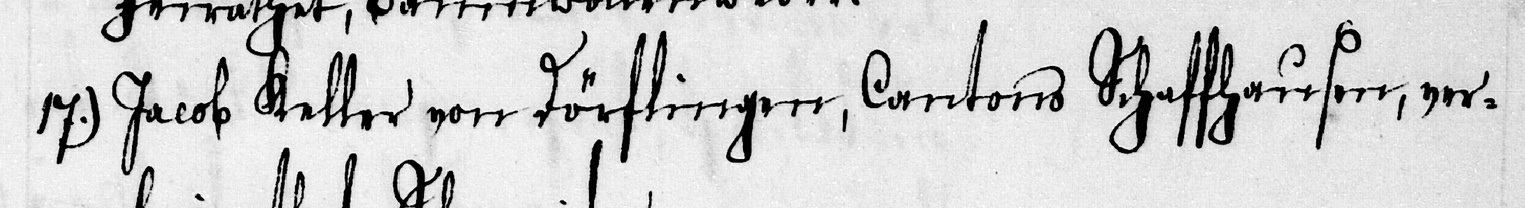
17.) Jacob Keller von Dörflingen, Cantons Schaffhausen, ver¬
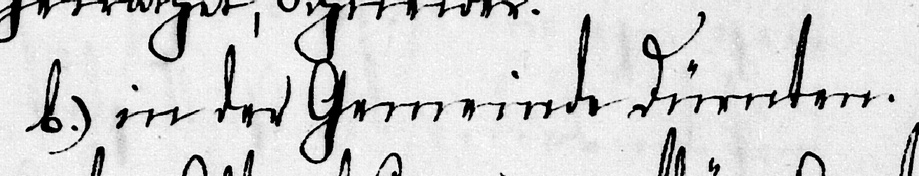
b.) in der Gemeinde Dürnten.
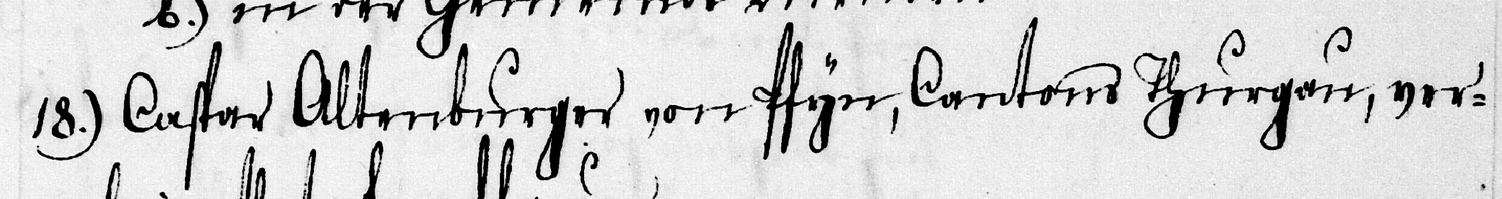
18.) Caspar Altenburger von Pfyn, Cantons Thurgau, ver¬
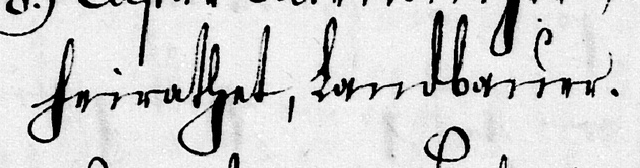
heirathet, Landbauer.
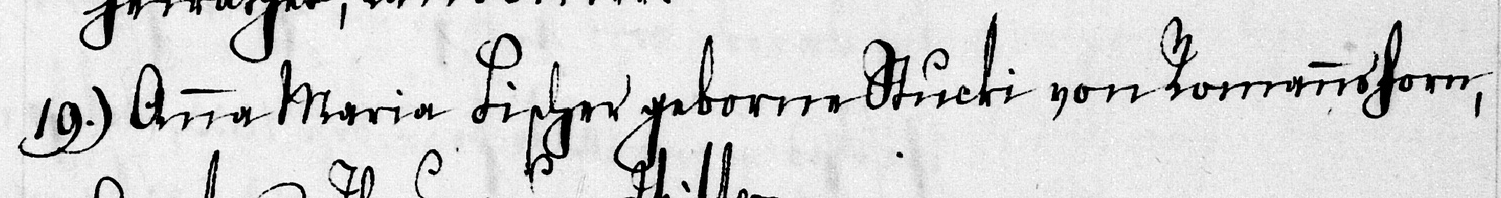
19.) Anna Maria Fischer geborne Stucki von Romannshorn,
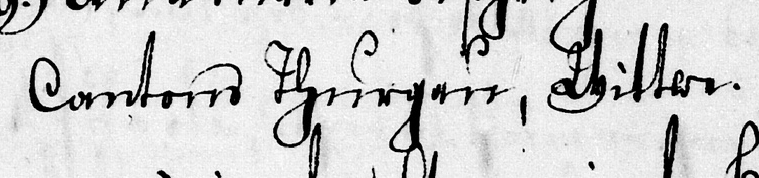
Cantons Thurgau, Wittwe.
